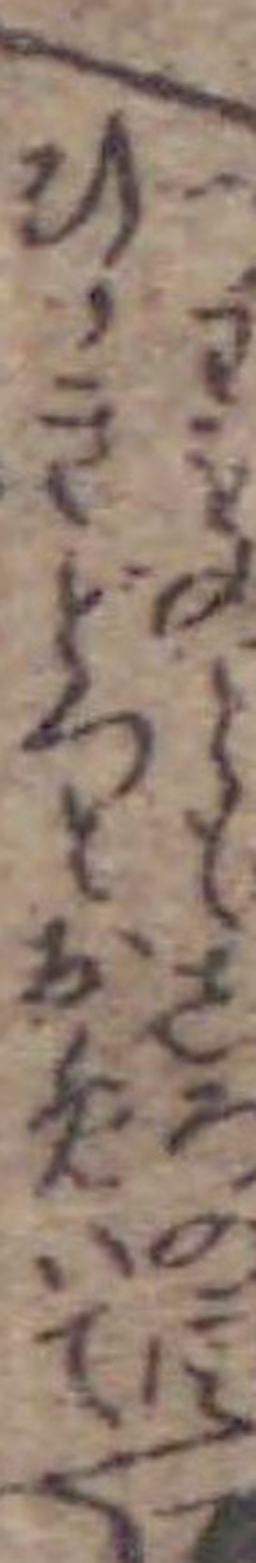ひらきどつとおめいて
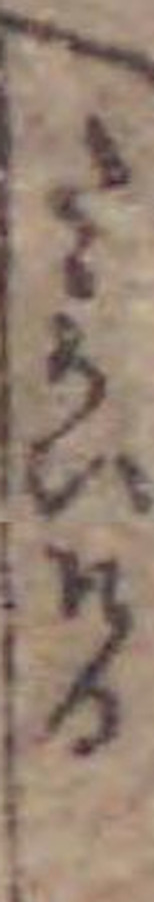たゝかいける
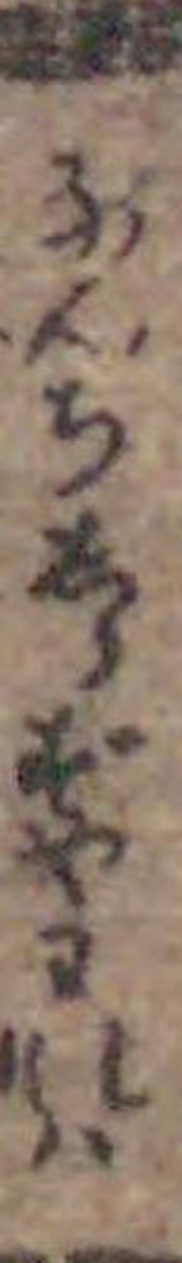なんちしらずやわれは

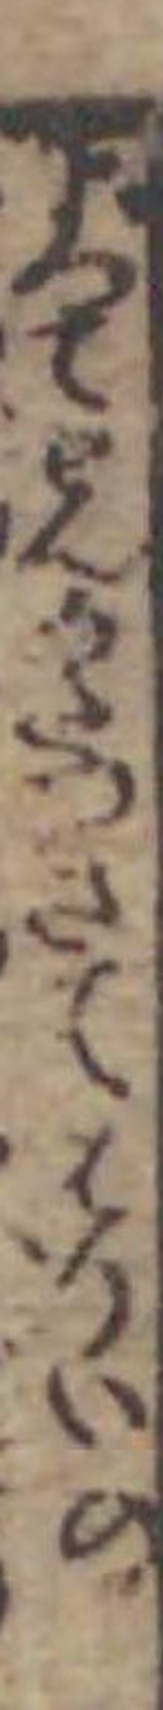よつてせんかたつきてはりいの
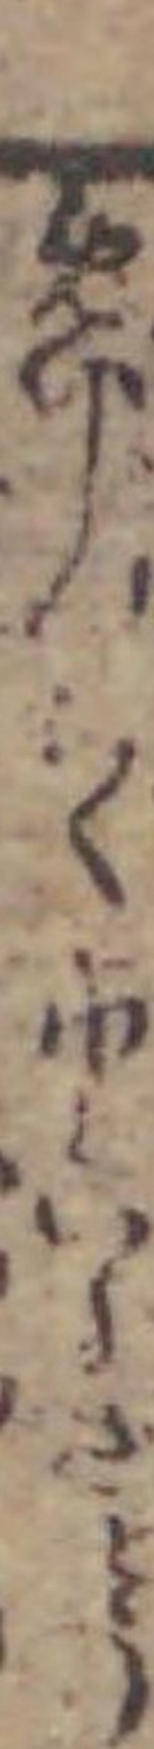めいじんちく市といふざとう
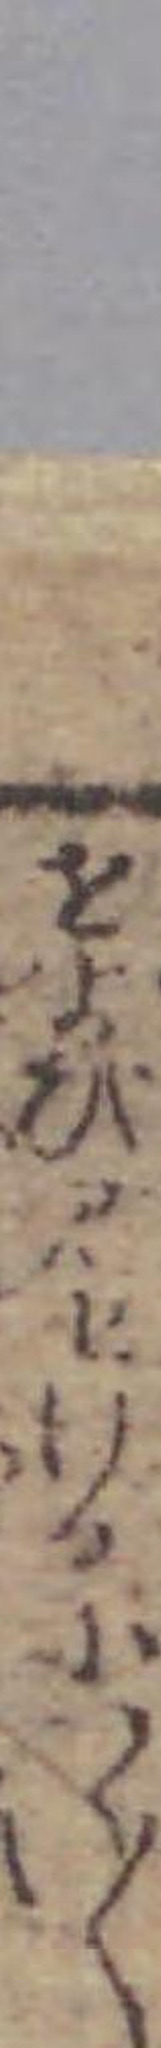をよび見せけるにつく〳〵
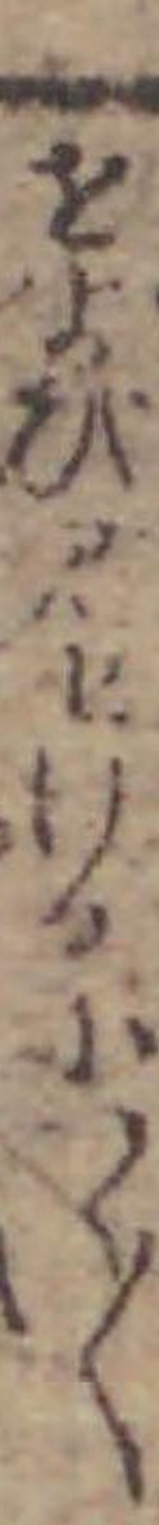をよび見せけるにつく〳〵
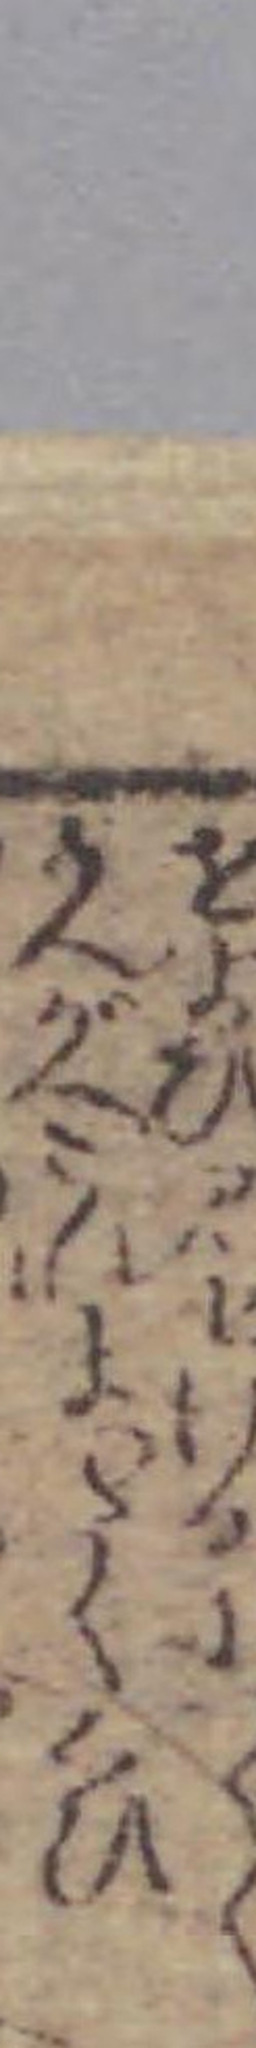かんがへこれまつたくくひ
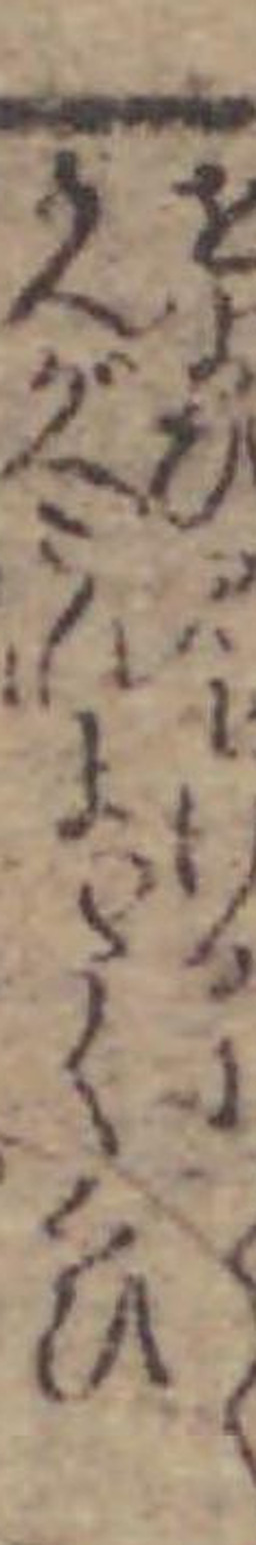かんがへこれまつたくくひ
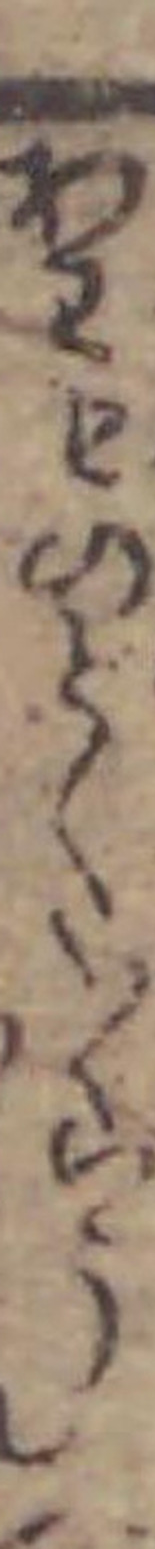あわせのどくふくちう
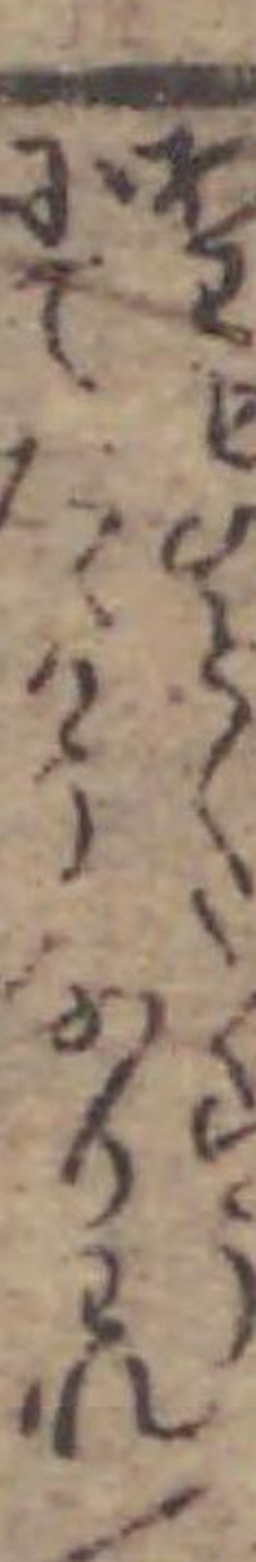にてたゝかうなりわれ
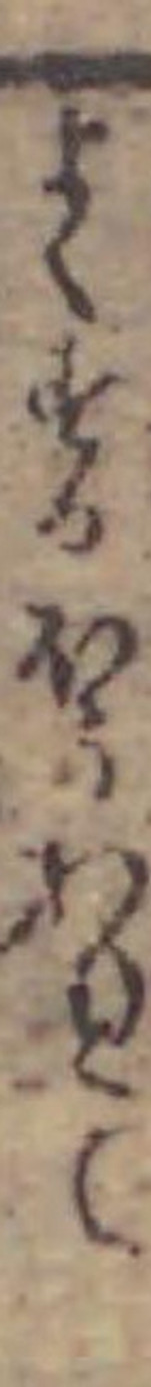よくするほうありとて
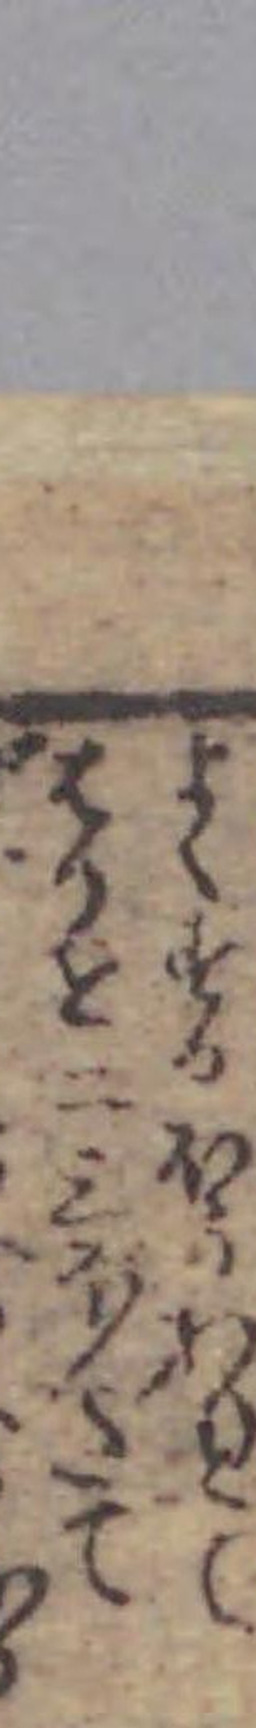はりを二三ぼんたて
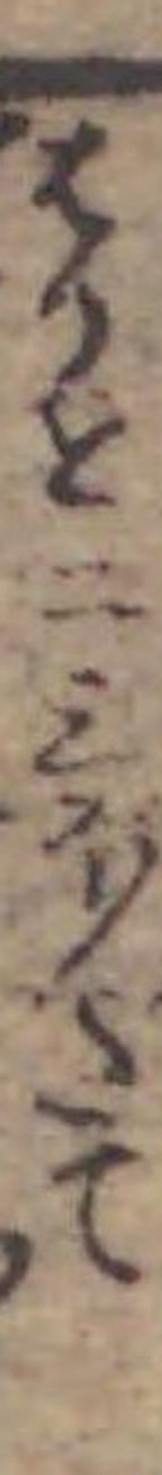はりを二三ぼんたて
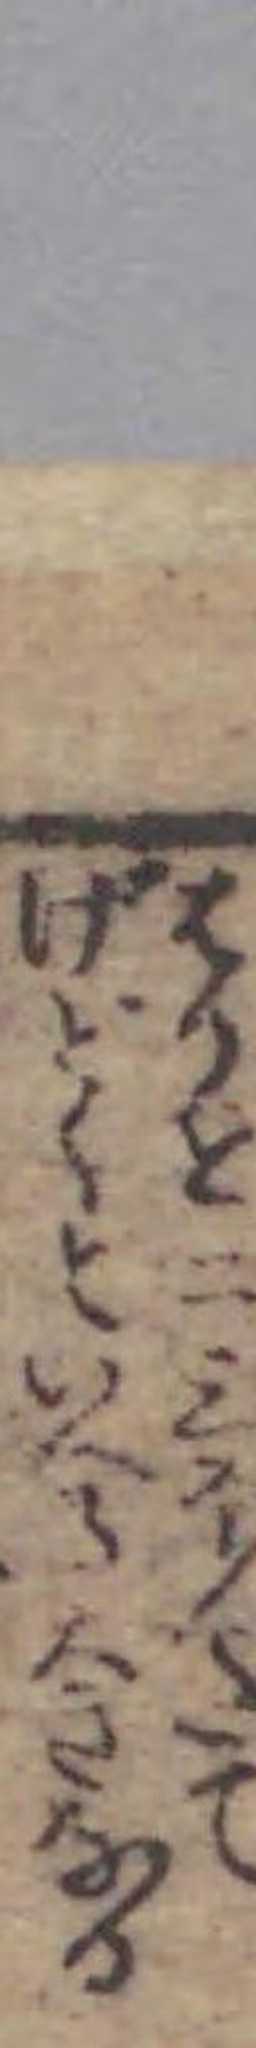げどくといへる大きなる
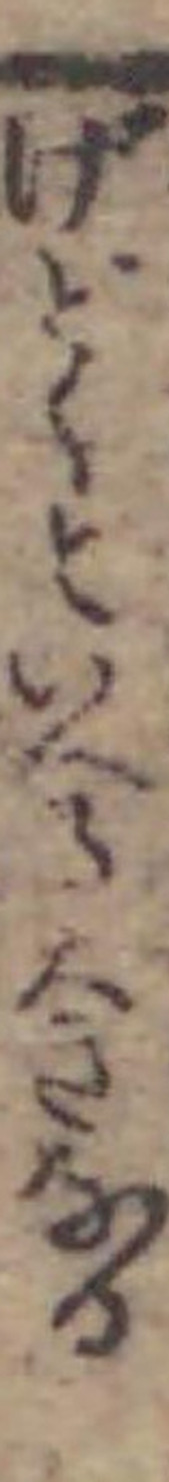げどくといへる大きなる
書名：腹京師食物合戦 : 2巻
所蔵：国立国会図書館 National Diet Library, JAPAN
